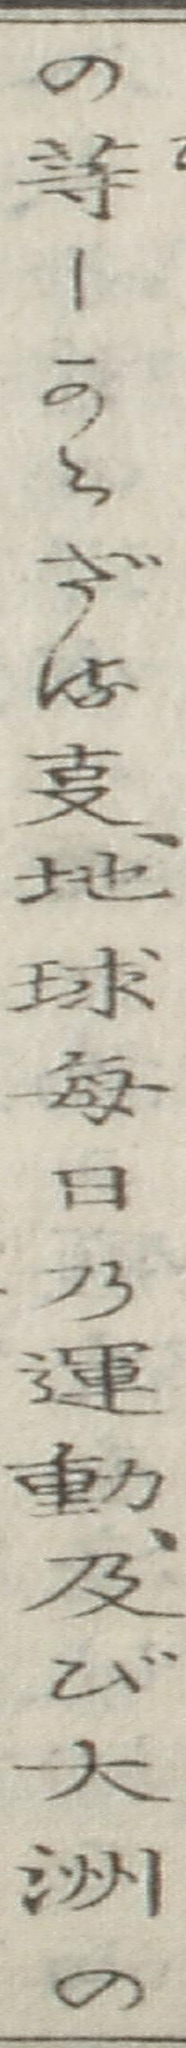の等しからざる事、地球毎日の運動、及び大洲の
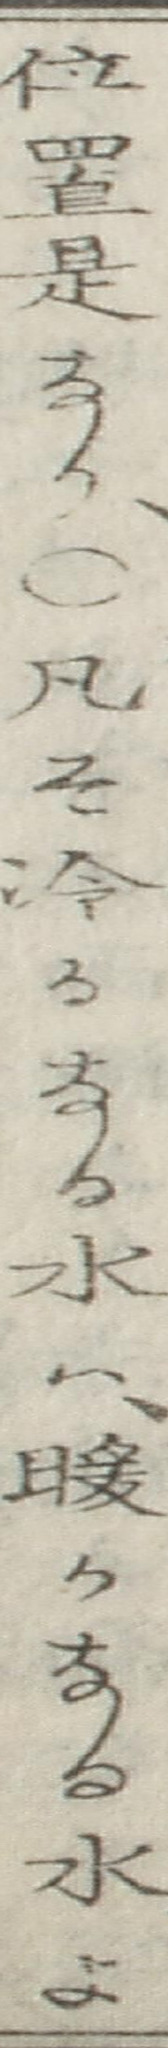位置是なり、〇凡そ冷かなる水は、暖かなる水よ

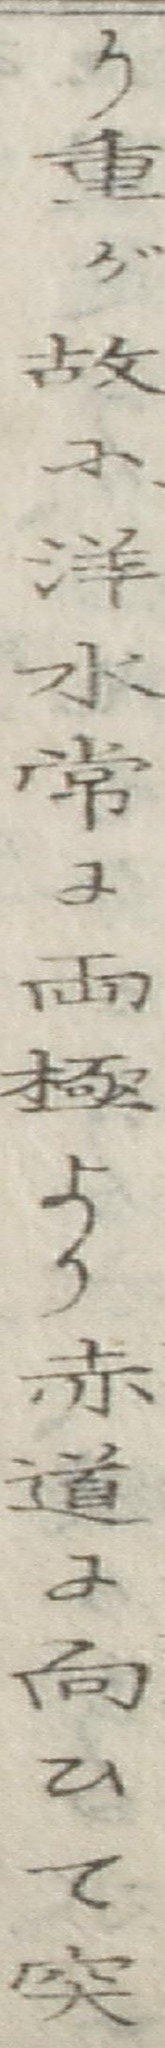り重が故に、洋水常に両極より赤道に向ひて突
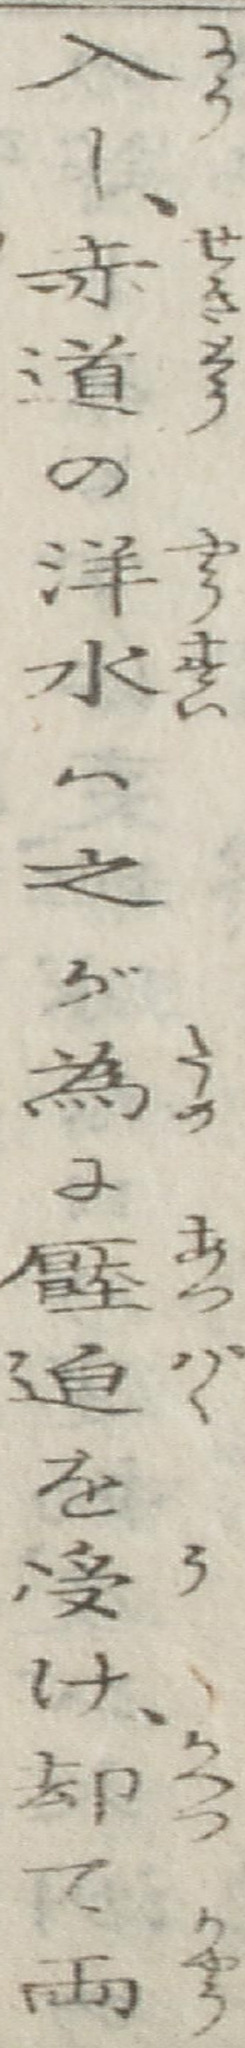入し、赤道の洋水は之が為に圧迫を受け、却て両
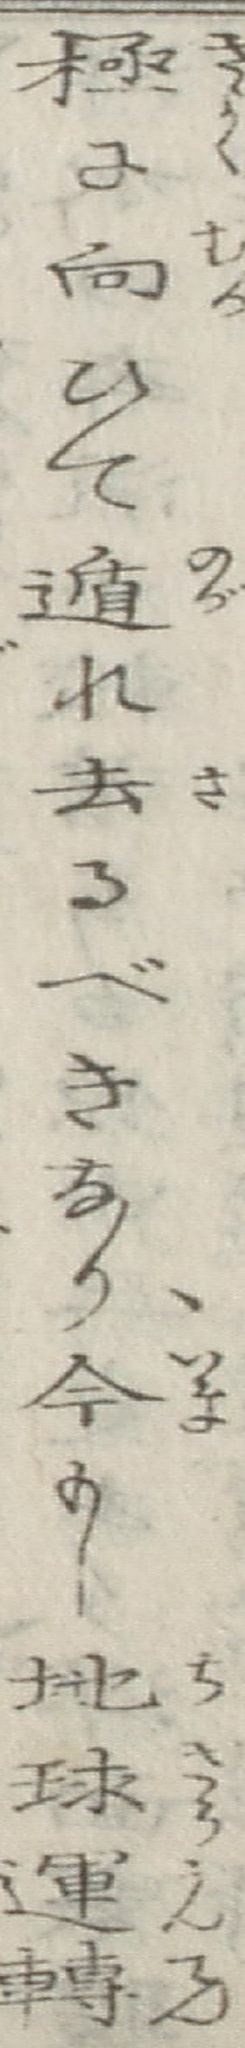極に向ひて遁れ去るべきなり、今もし地球運転
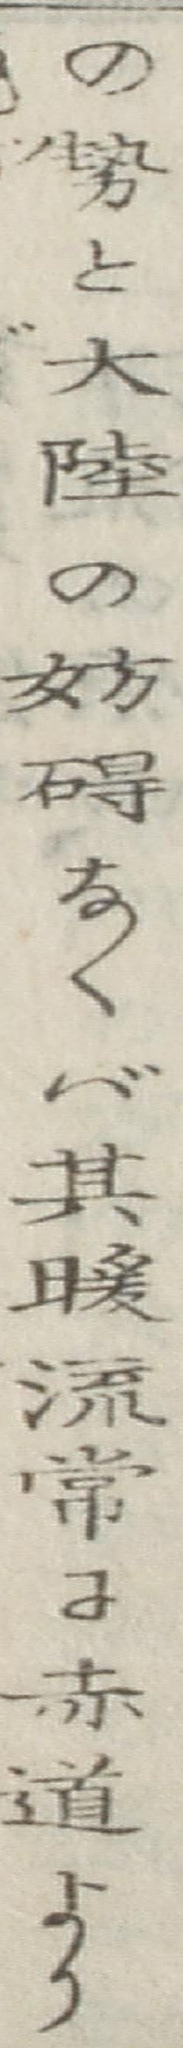の勢と大陸の妨碍なくば、其暖流常に赤道より
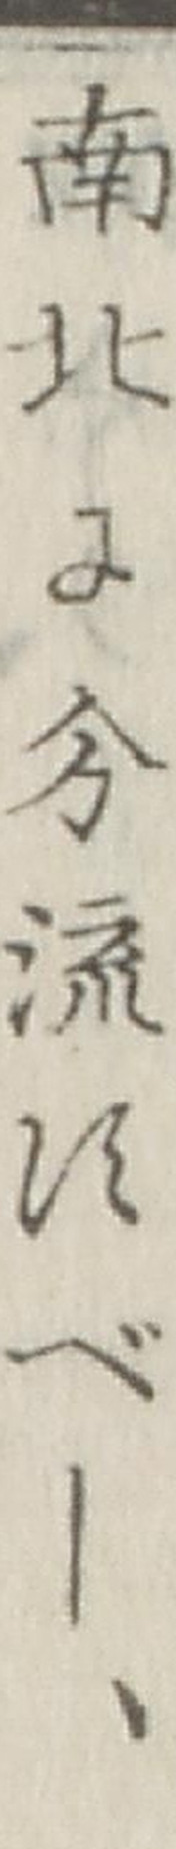南北に分流すべし、
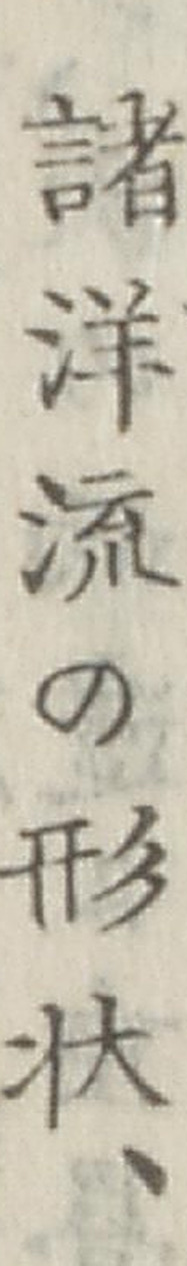諸洋流の形状、
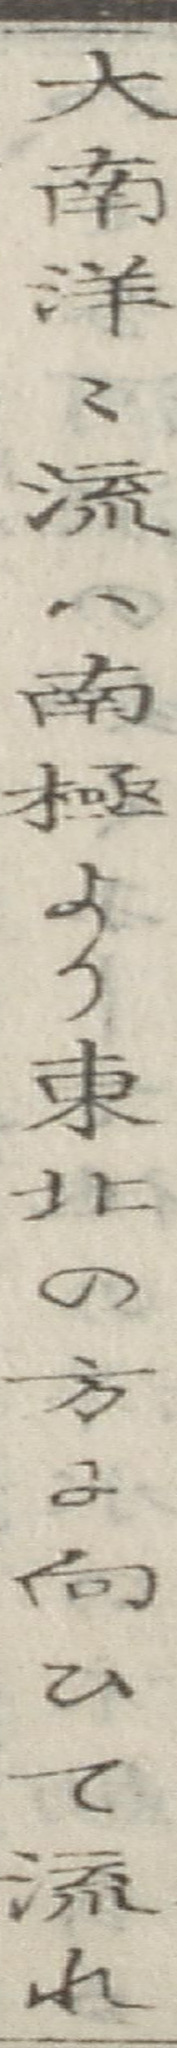大南洋〻流は南極より東北の方に向ひて流れ、
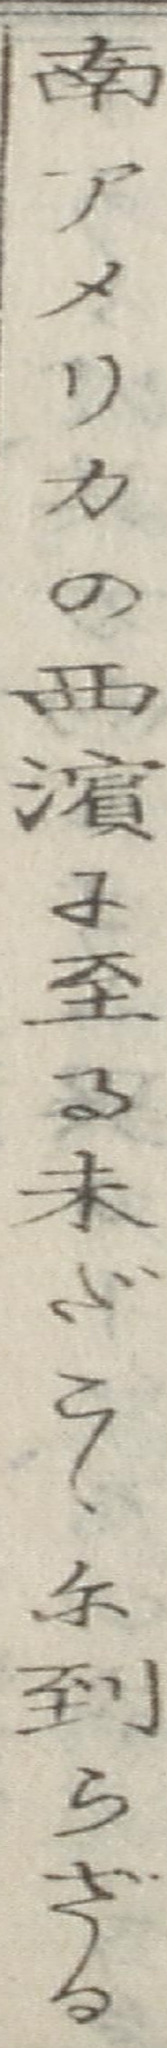南アメリカの西濵に至る、未だこゝに到らざる
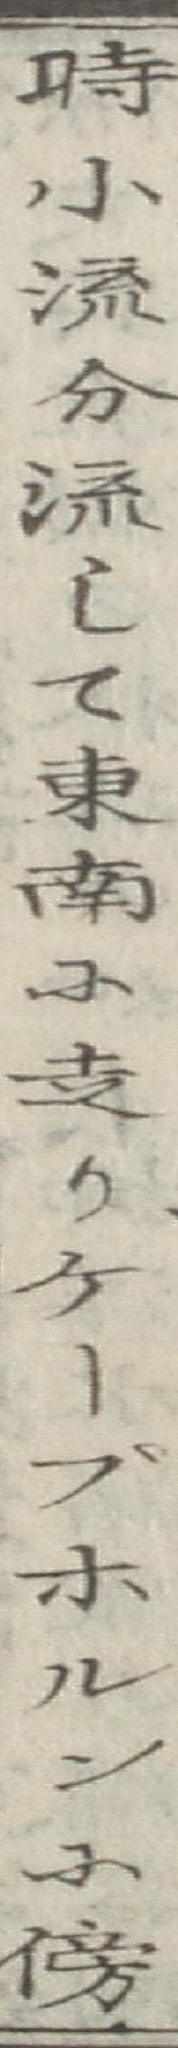時小流分流して東南に走り、ケープホルンに傍
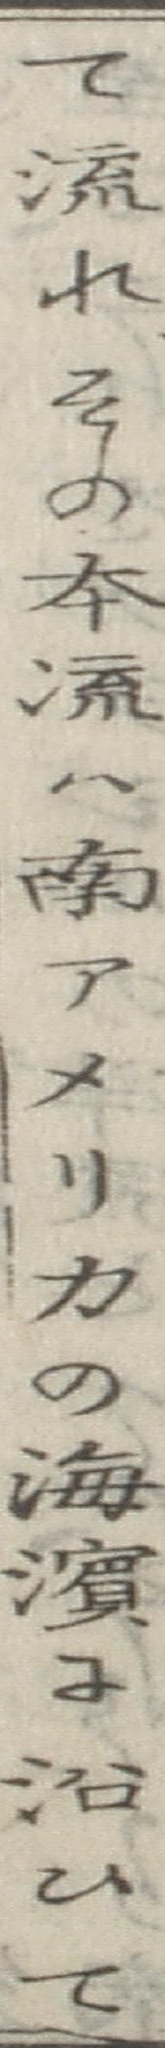て流れ、その本流は南アメリカの海浜に沿ひて
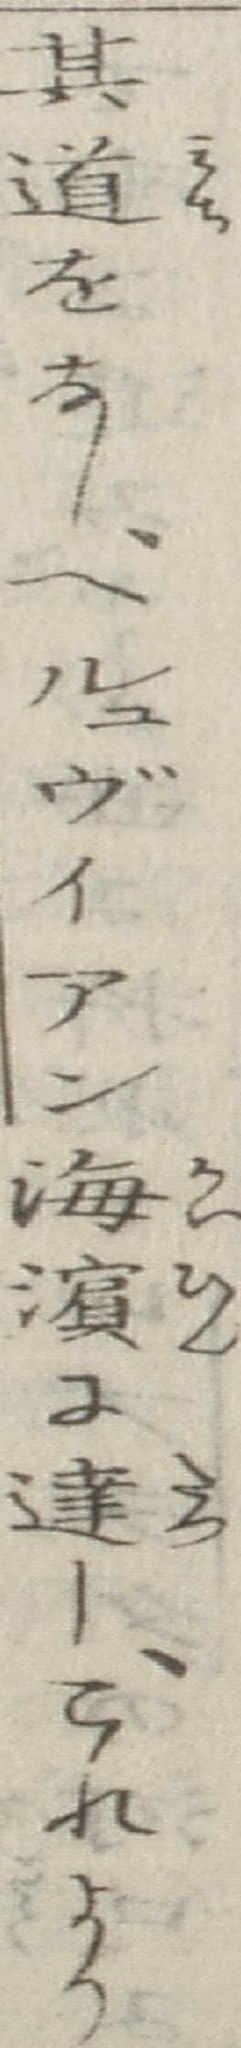其道をなし、ヘルュヴイアン海浜に達し、これより
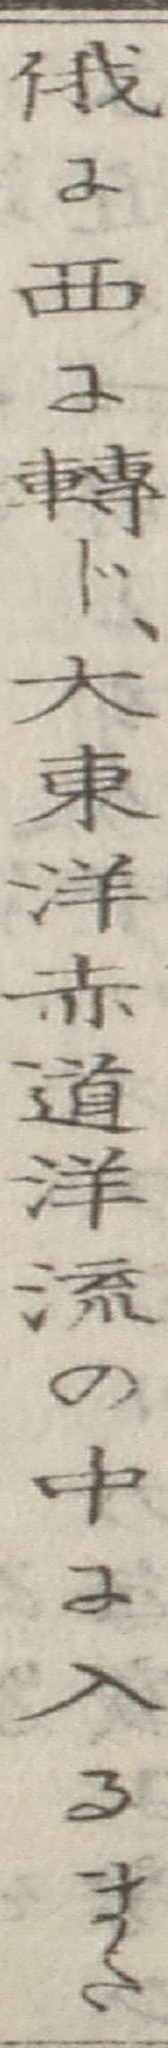俄に西に転じ、大東洋赤道洋流の中に入る、また
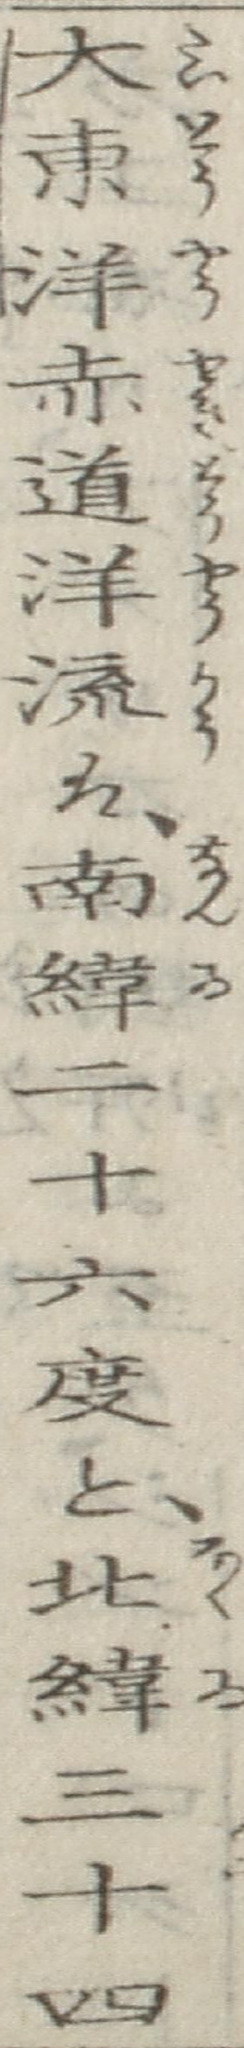大東洋赤道洋流は、南緯二十六度と、北緯三十四
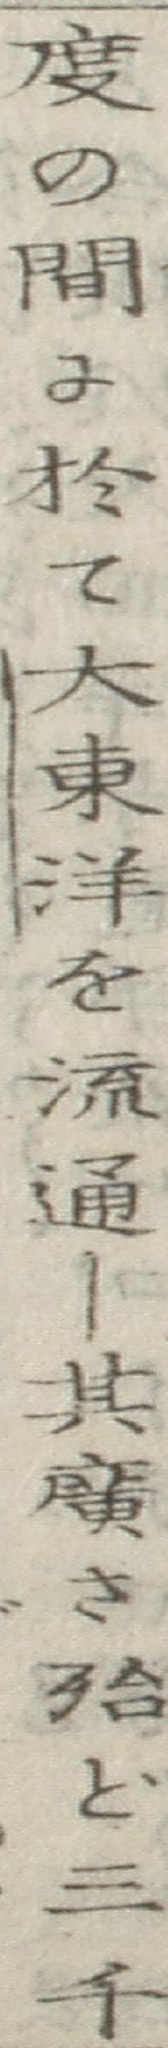度の間に於て、大東洋を流通し、其広さ殆ど三千
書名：訓蒙　天然地理學　中
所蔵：東京大学地震研究所図書室 Earthquake Research Institute Library, The University of Tokyo, JAPAN
